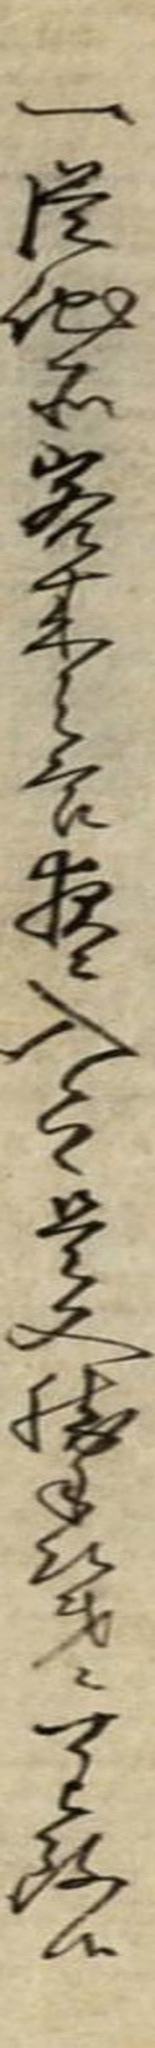一従他所客来之節夜に入候はゝ是又勝手次第に可被致候
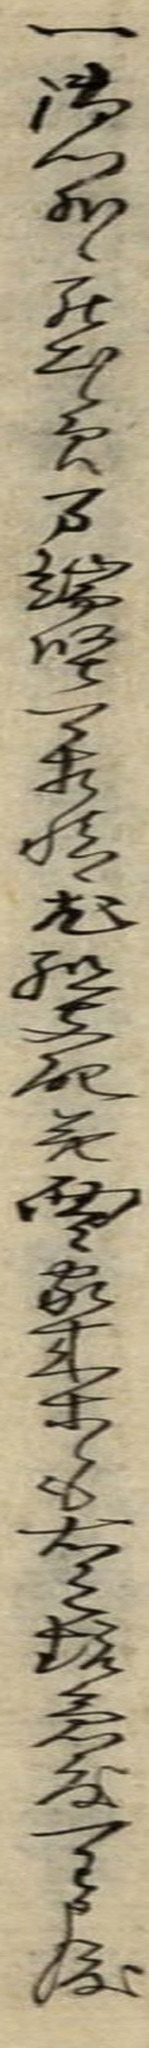一御門外へ罷出候ては万端堅可相慎尤組支配幷面々家来等へも右之趣急度可被申渡
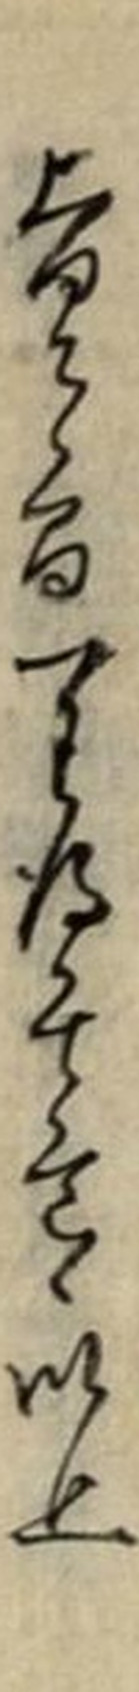旨に候間可被得其意候以上
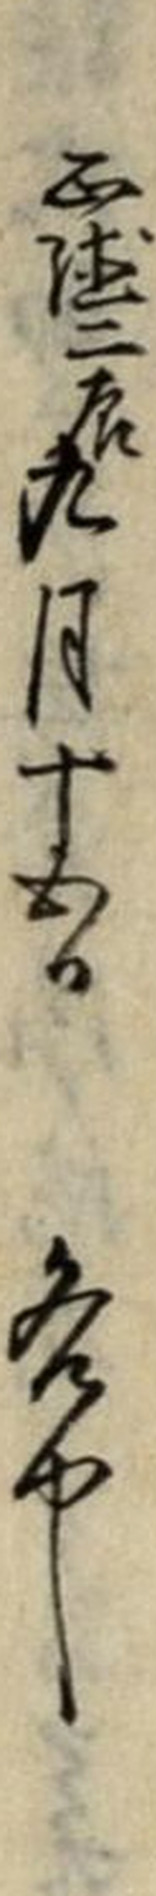正徳二辰九月十九日各中目付中
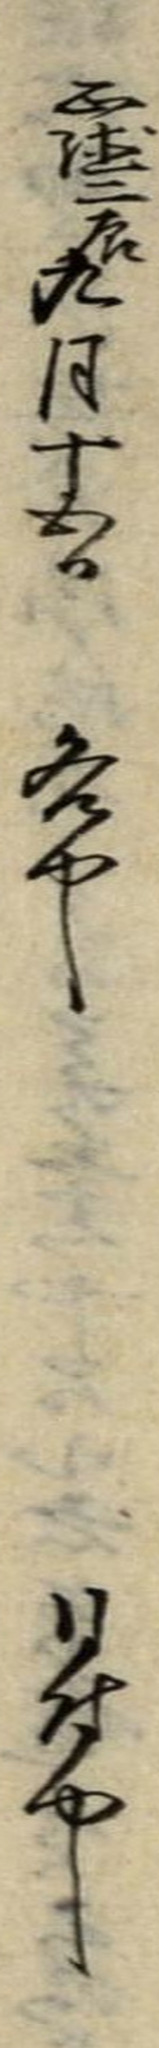正徳二辰九月十九日各中目付中
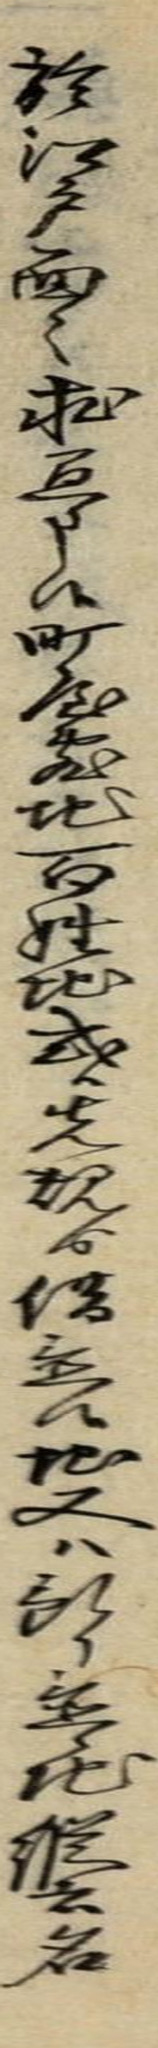於江戸面々求置申候町屋敷地百姓地或は先規ゟ借置候地又は預り置候地縦令名
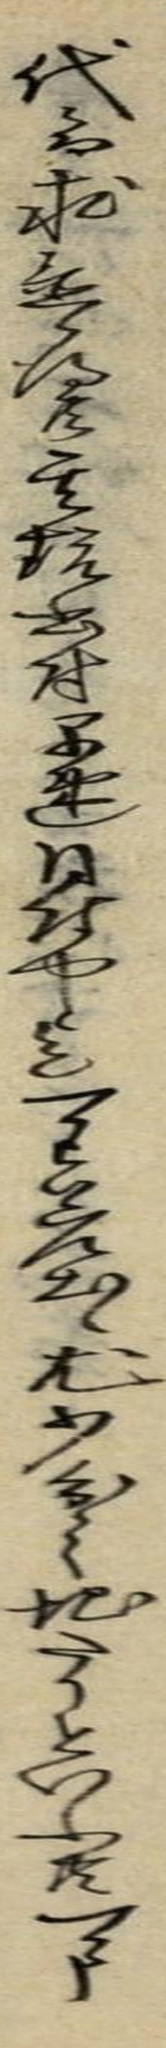代にて求置候得共其趣書付早速目付中迄可被差出候尤少分之地たりといふ共可申
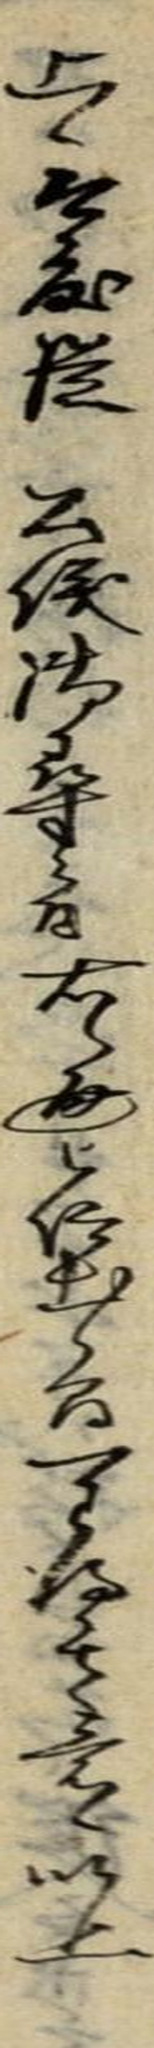上候今度従公儀御尋に付右之通被仰出候間可被得其意候以上
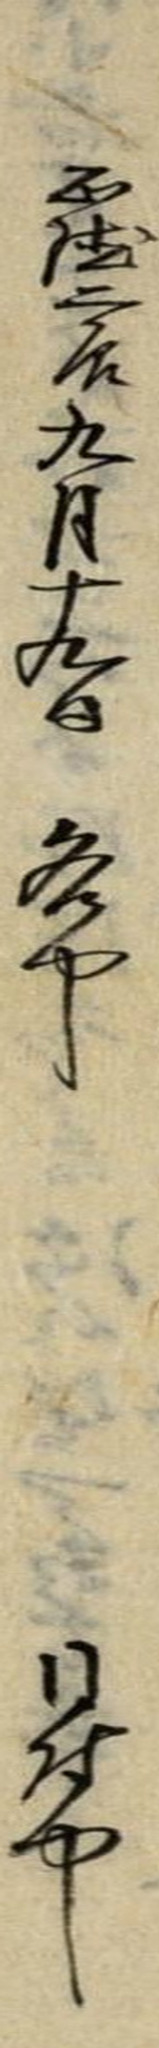正徳二辰九月十九日各中目付中
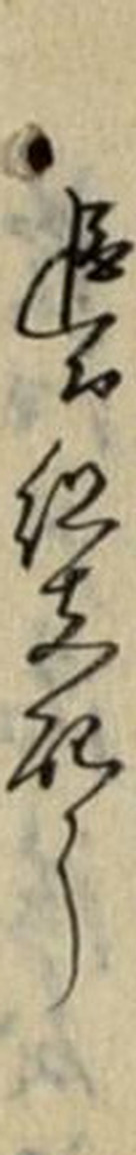追て組支配へ
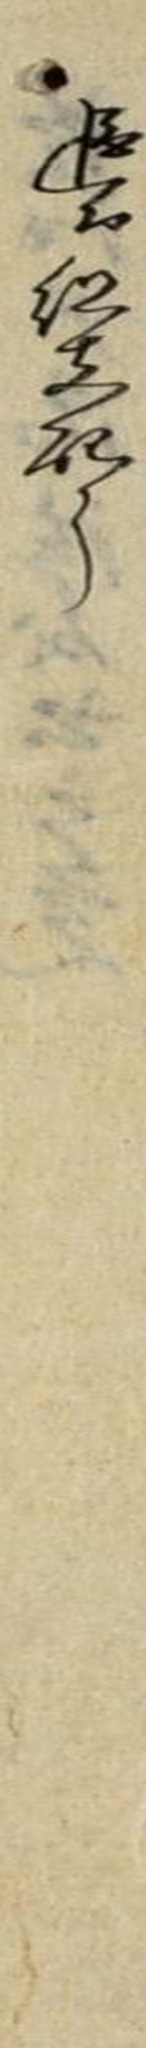追て組支配へ
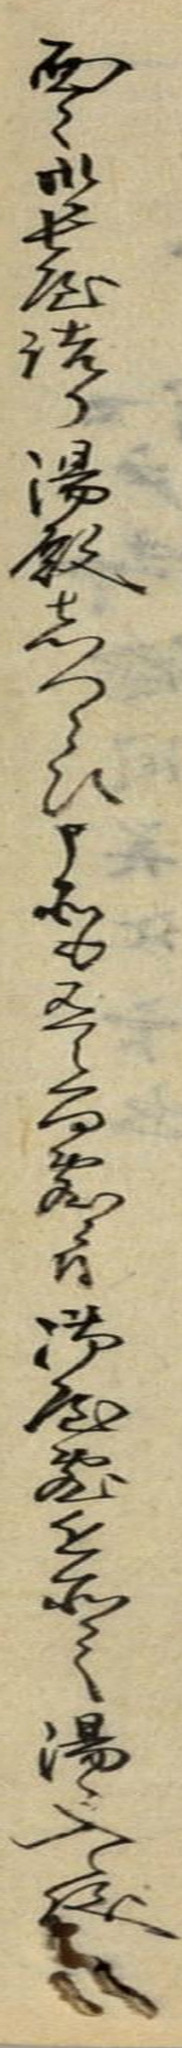面々御長屋詰り湯殿しつらひ申所も有之間敷に付御屋敷近所之湯に入候儀
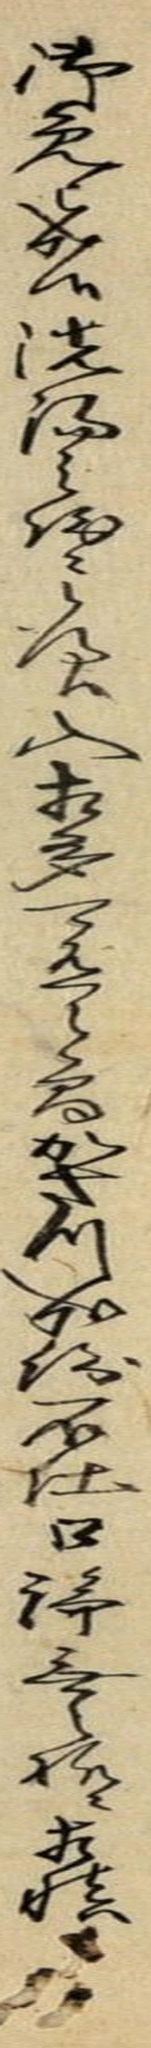御免被成候洗湯之儀に候得は入相多可有之候間かさつ成儀不仕口論無之様に相慎
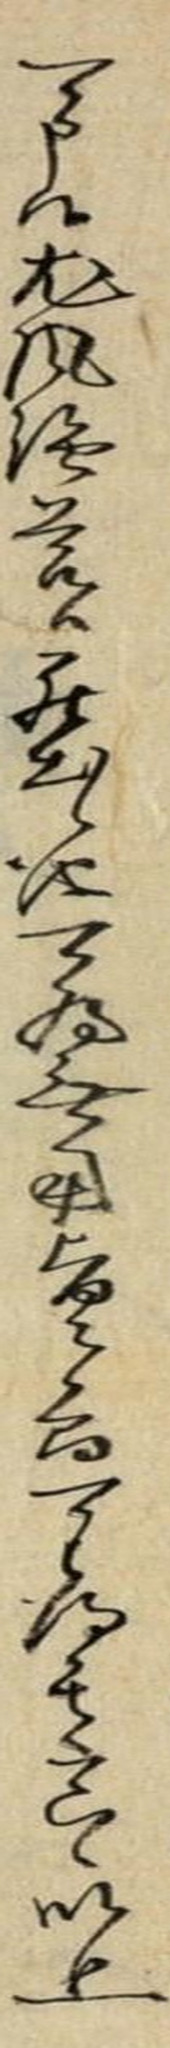可申候尤風強節は罷出候儀可為無用旨に候間可被得其意候以上
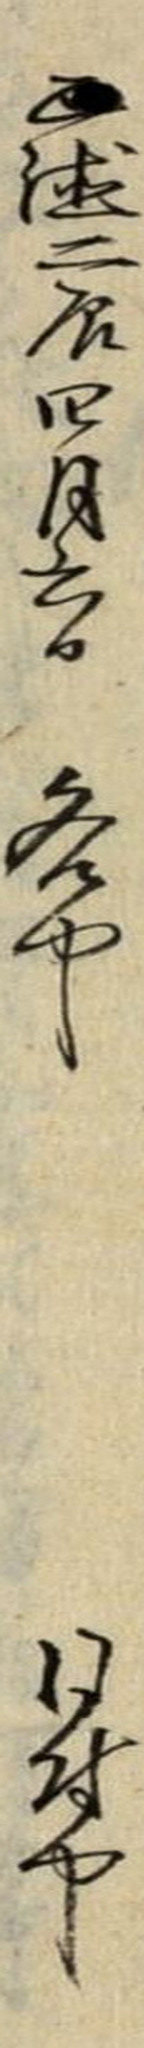正徳二辰四月六日各中目付中
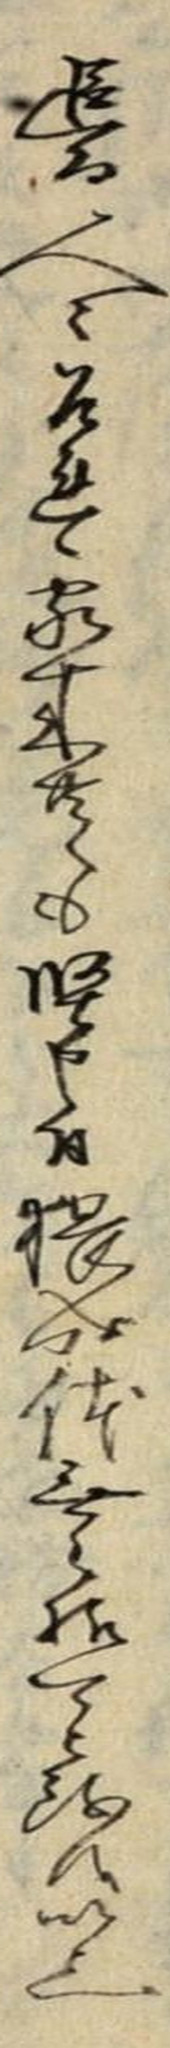追て人々召連候家来共へも堅申付猥成体無之様可被致候以上
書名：三都并道中之部
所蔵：福井県文書館 Fukui Prefectural Archives
